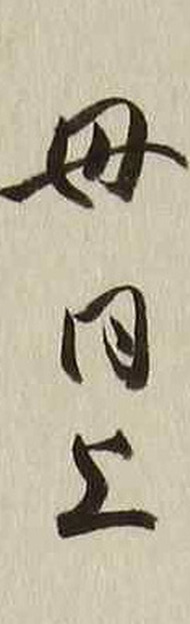母同上
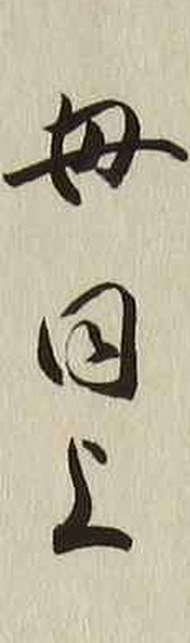母同上
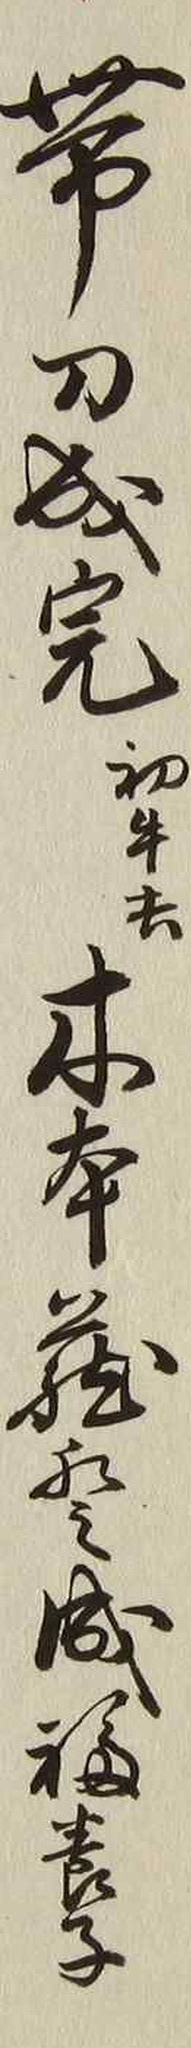帯刀成完初牛吉木本蔵登成福養子
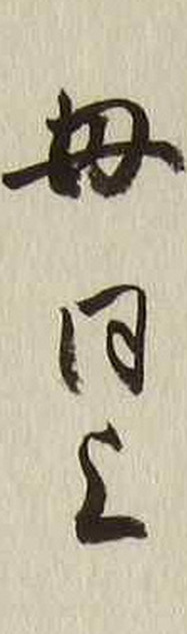母同上
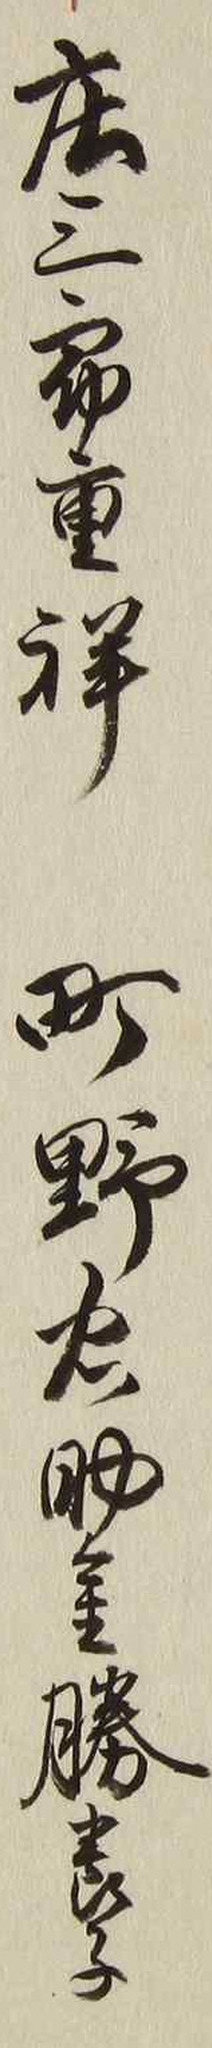庄三郎重祥町野忠助重勝養子
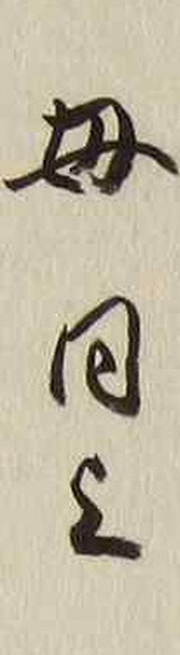母同上
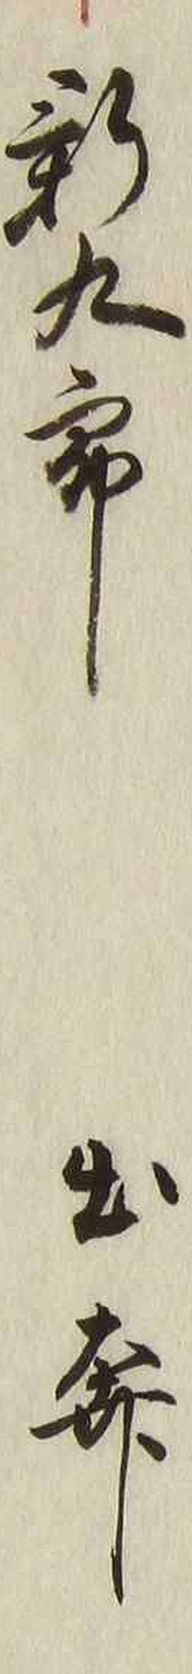新九郎出奔

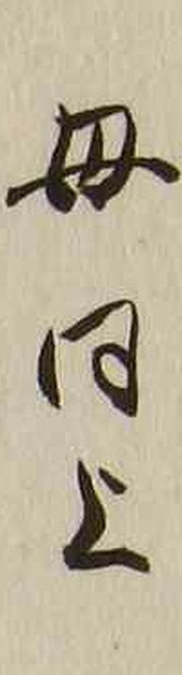母同上
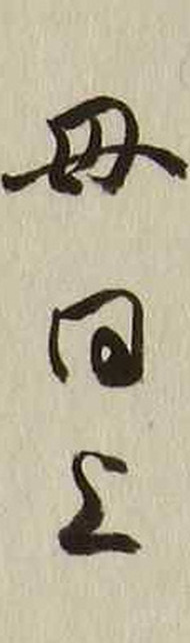母同上
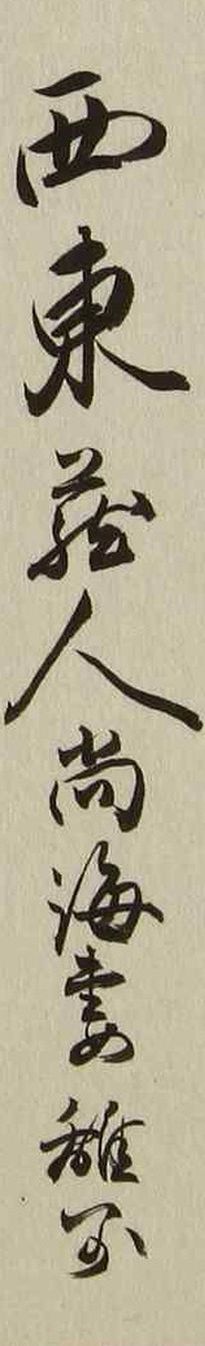西東蔵人尚海妻離別
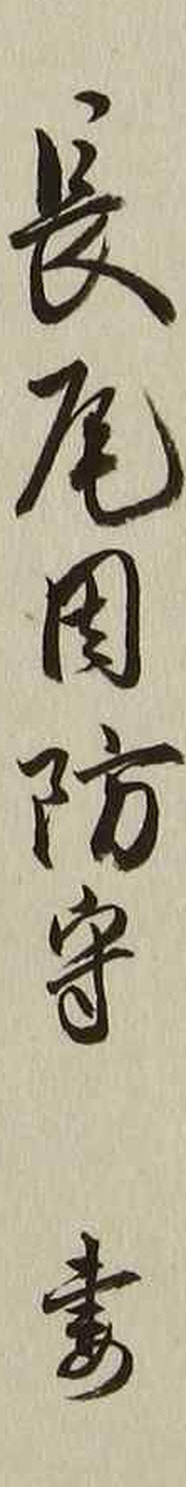女長尾周防守妻
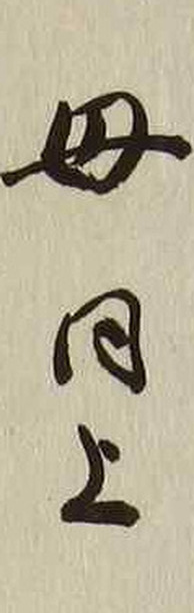母同上
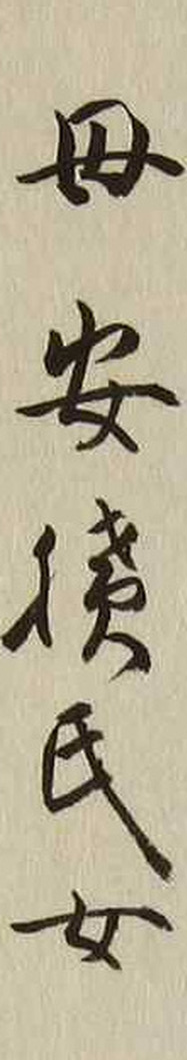母安積氏女
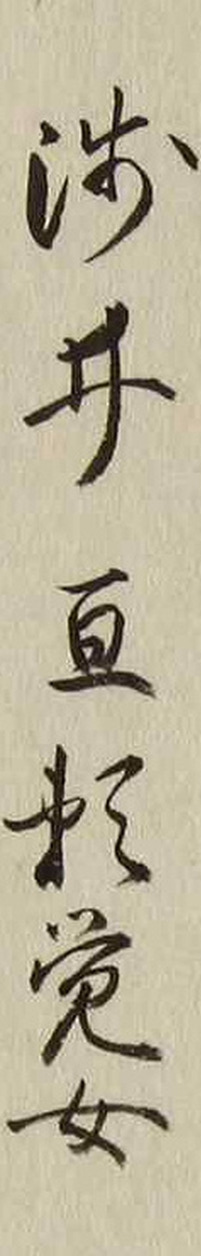浅井亘頼覚女
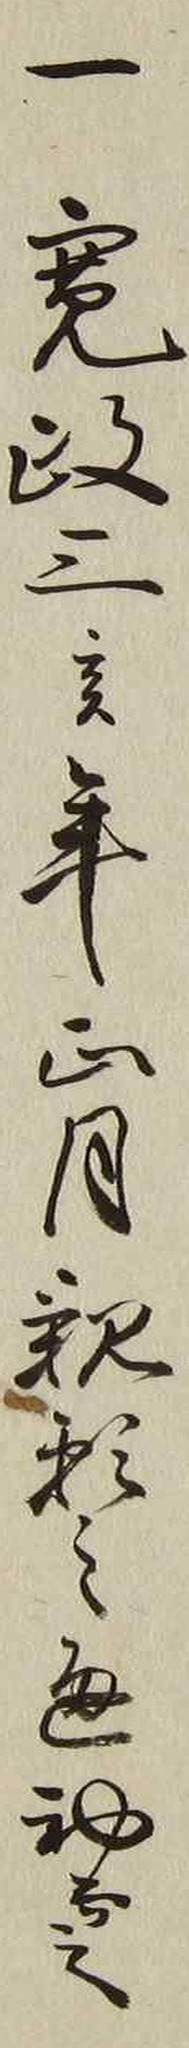一寛政三亥年正月親願之通初而之
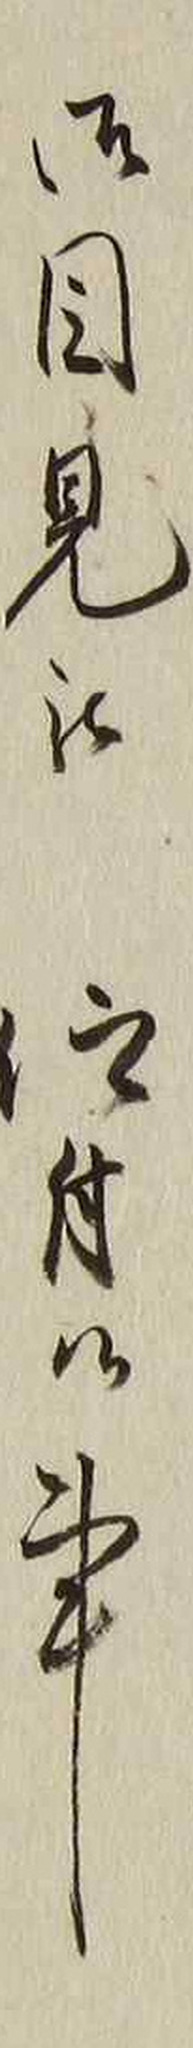御目見被仰付候事
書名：諸士系譜　巻之15　い之部15
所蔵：会津若松市立会津図書館
